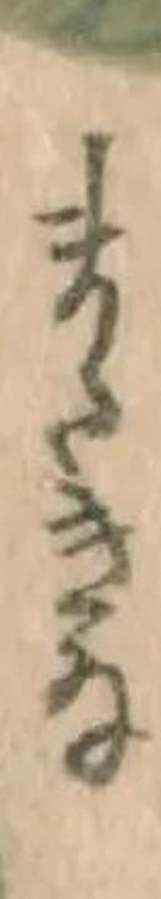またきな
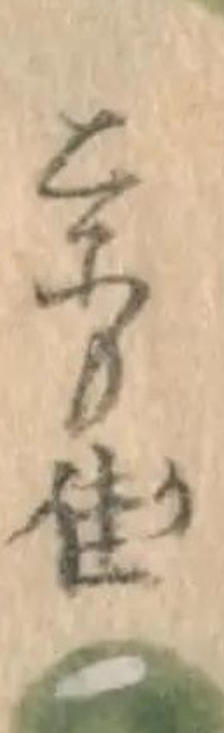こにも佳
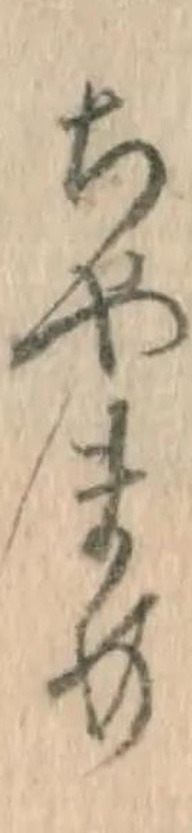ちやまめ
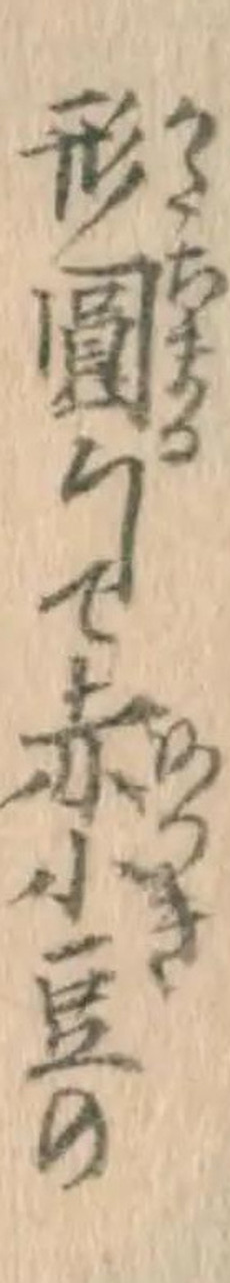形円くして赤小豆の
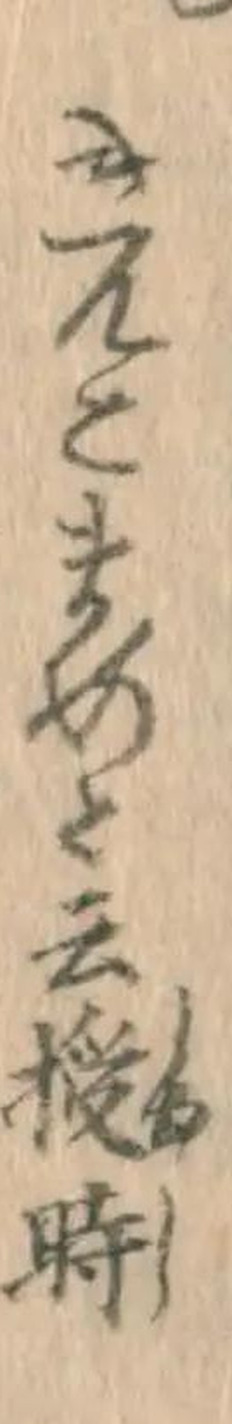きんこまめと云授時
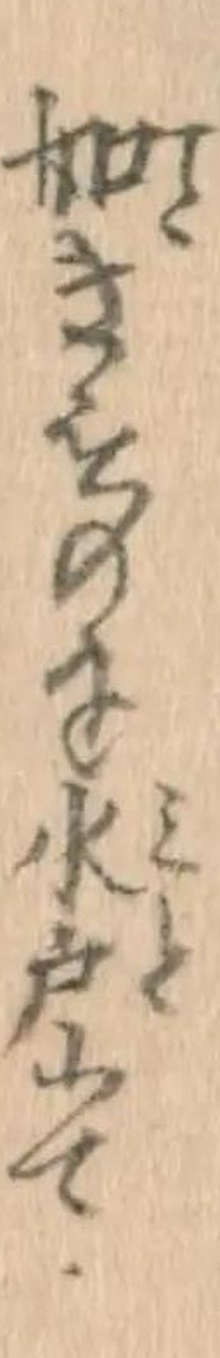如きものを水戸にて
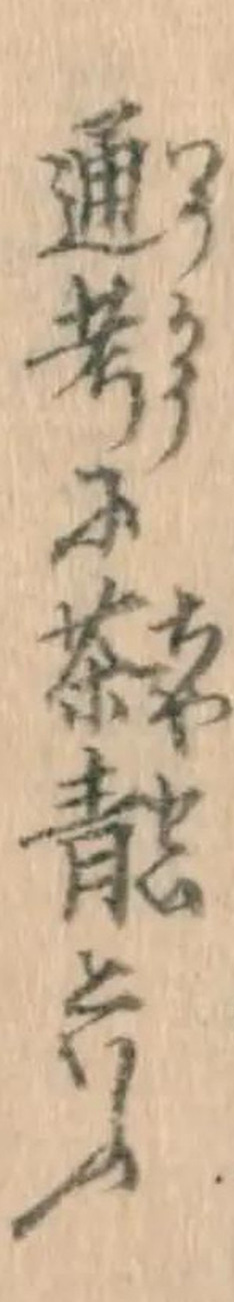通考に茶青といふ
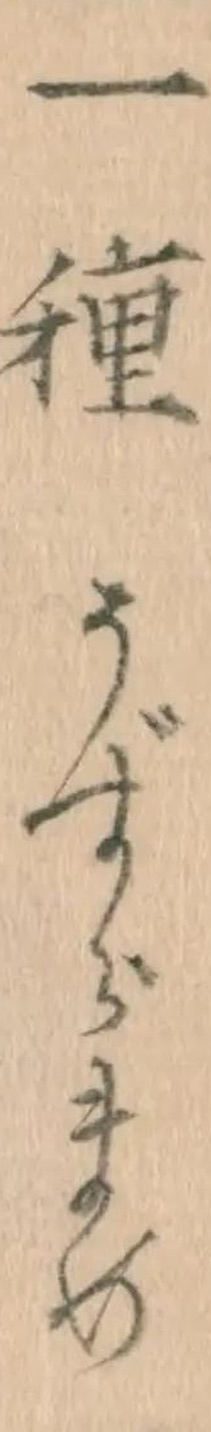一種うずらまめ
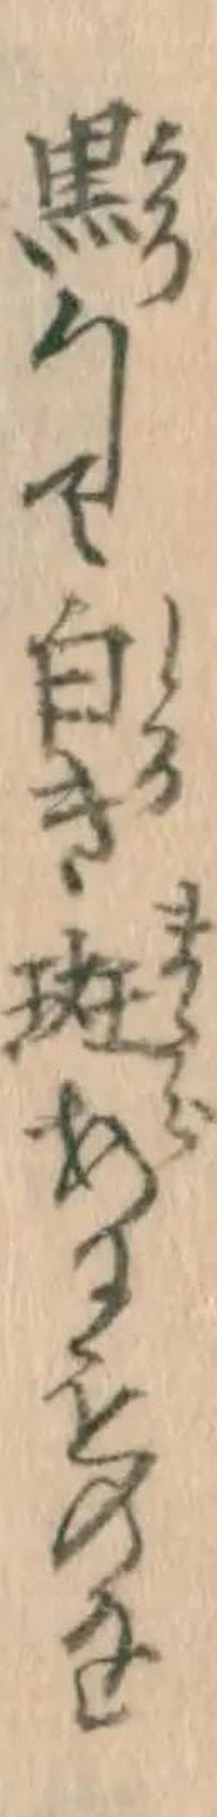黒くして白き斑あるものを
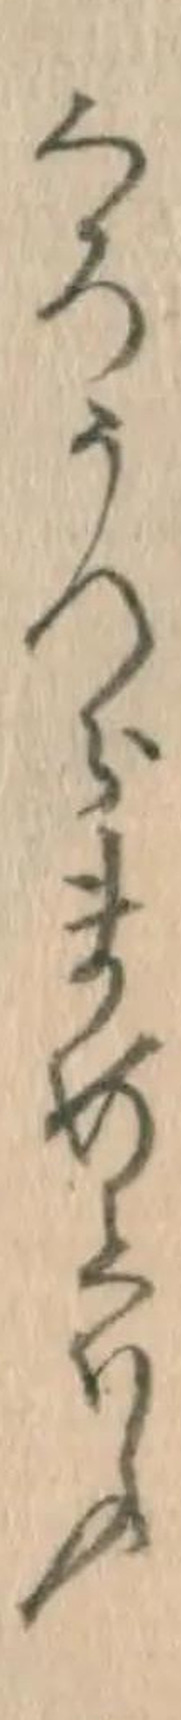くろうつらまめといふ
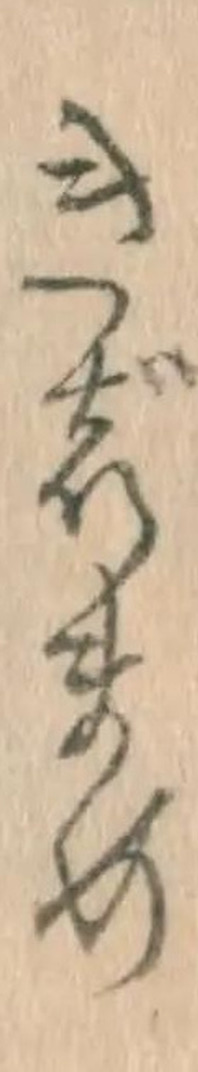きじまめ
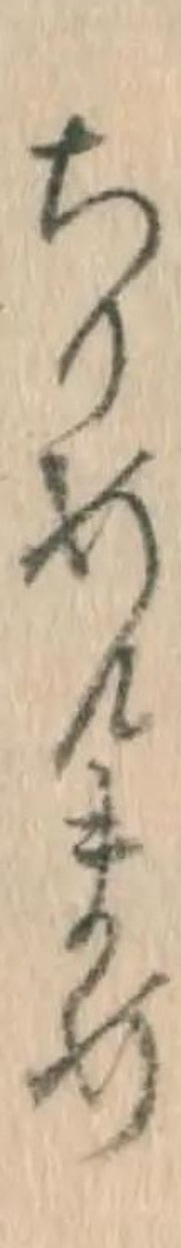ちりめんまめ
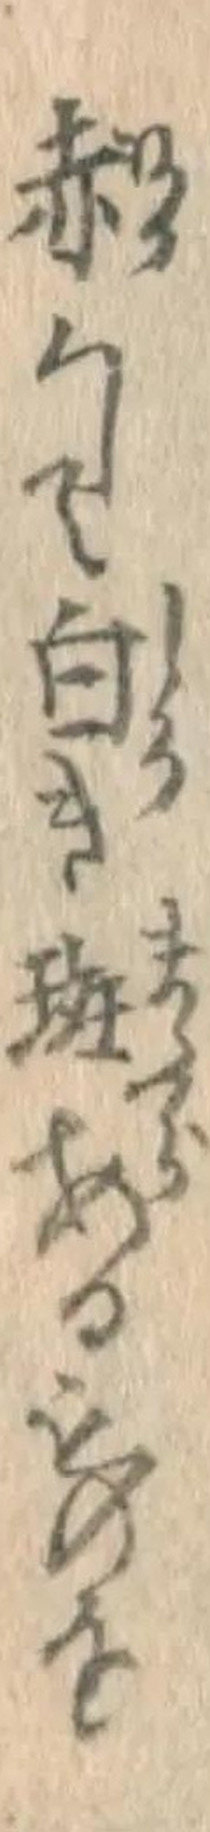赤くして白き斑あるものを
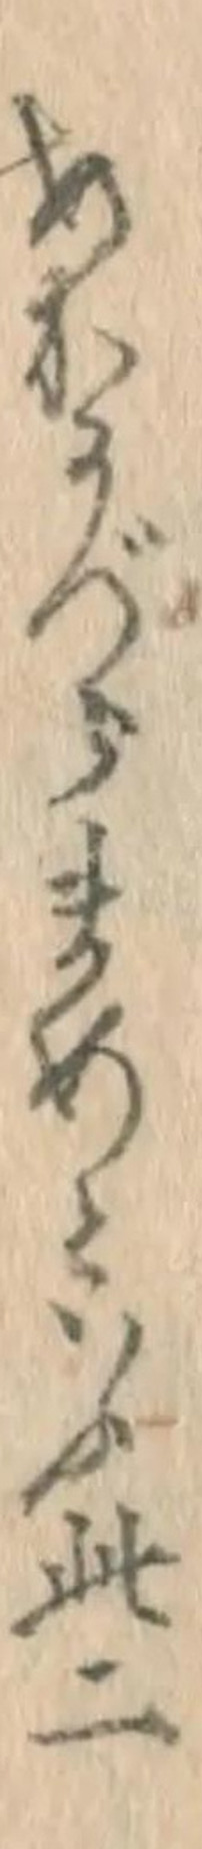あかうづらまめといふ此二
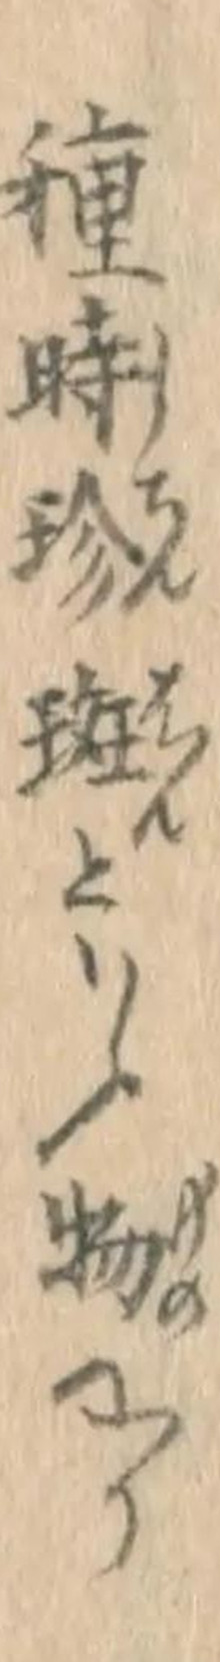種時珍斑といふ物なり

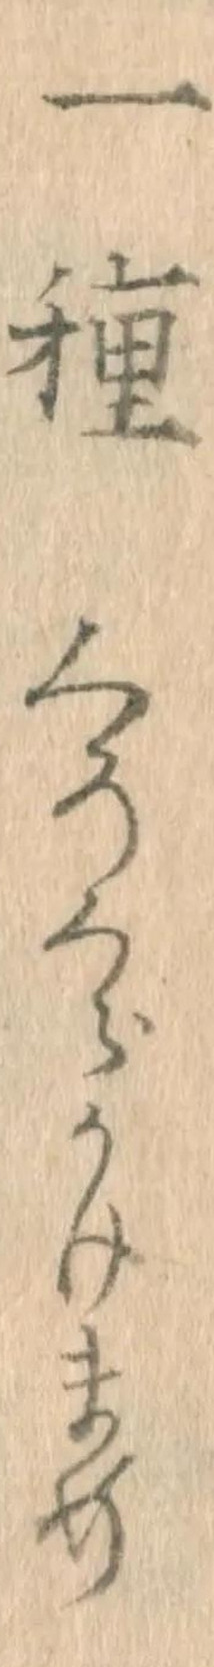一種くろくらかけまめ
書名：本草図譜. 巻43-45
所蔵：国立国会図書館 National Diet Library, JAPAN
